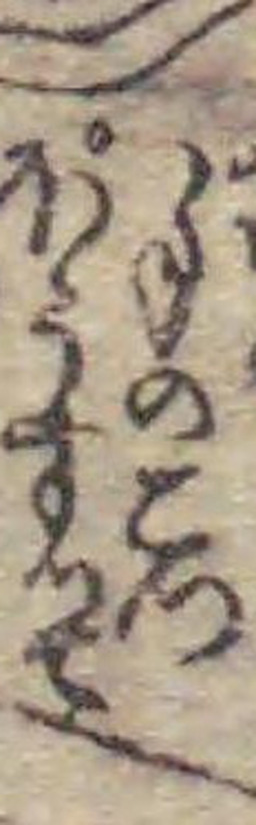ぽうすつて
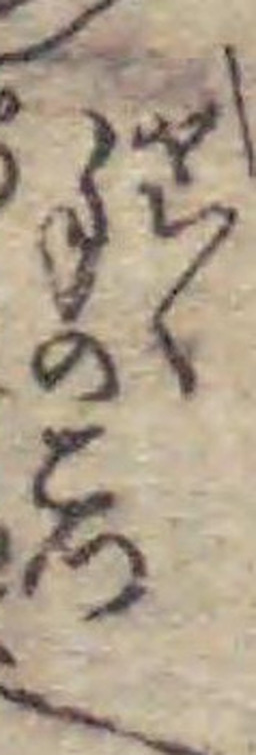手のこつ
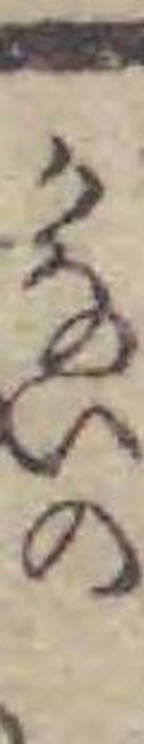かないの
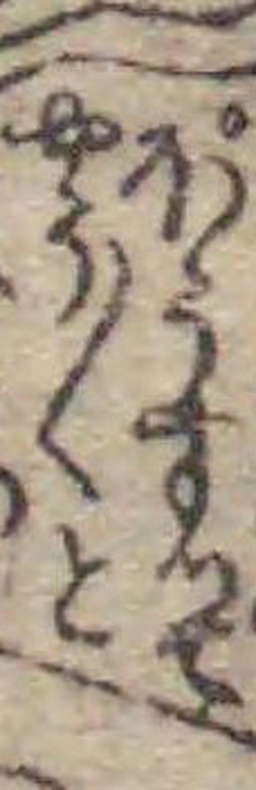やう〳〵と
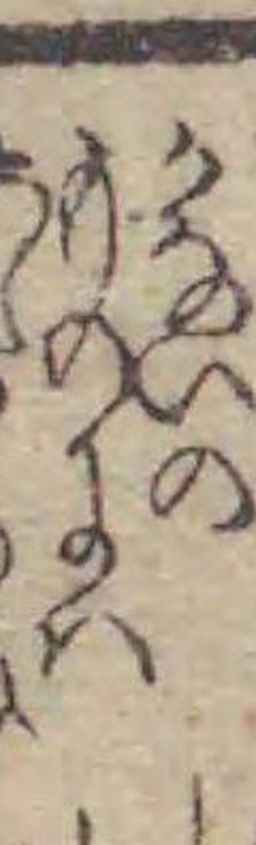ものには
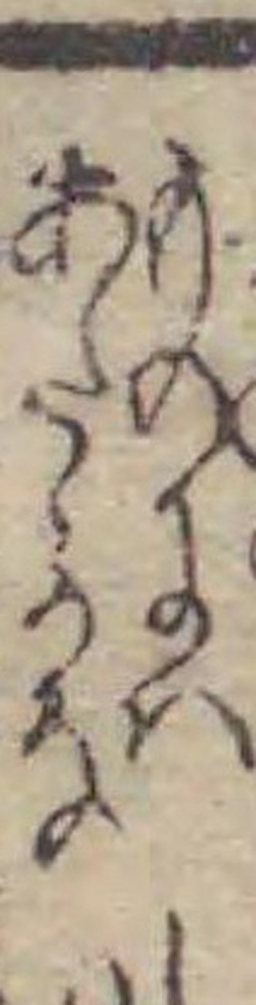あたゝかな
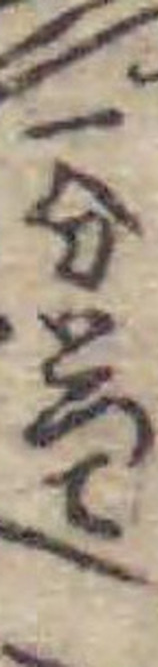一分とつて
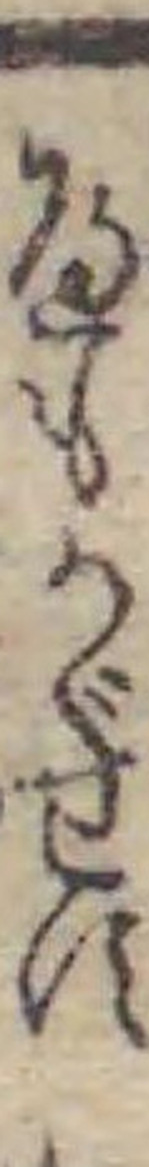へもかゞせず
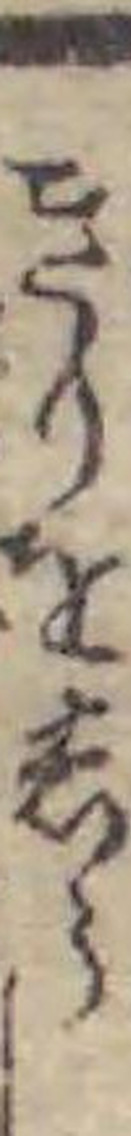きりをしら
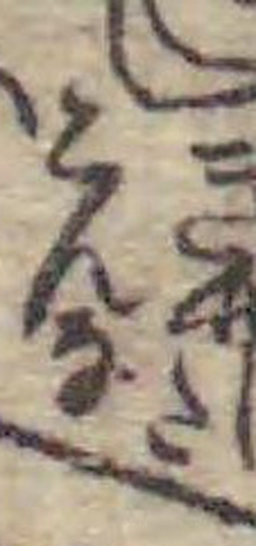こんな
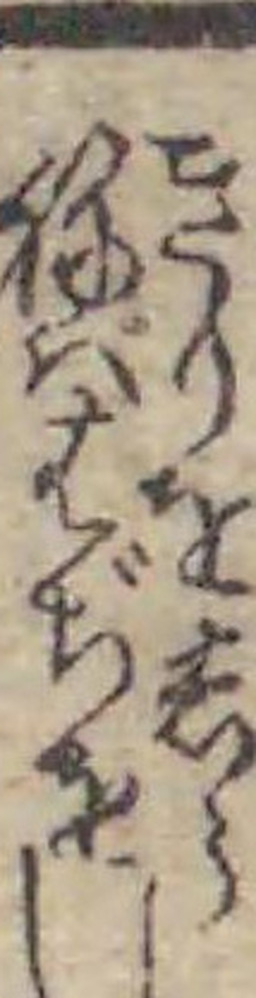ねばはぢを
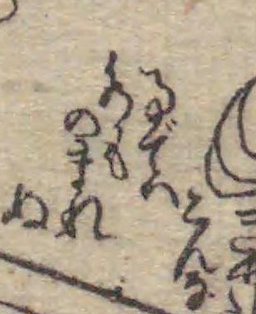のまれ
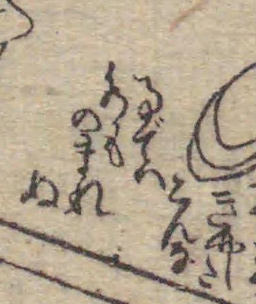のまれ
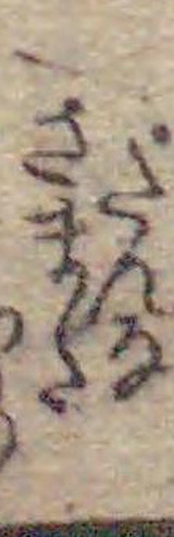さまた
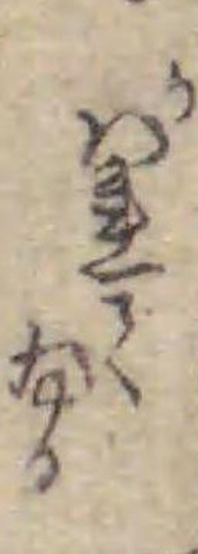はれて

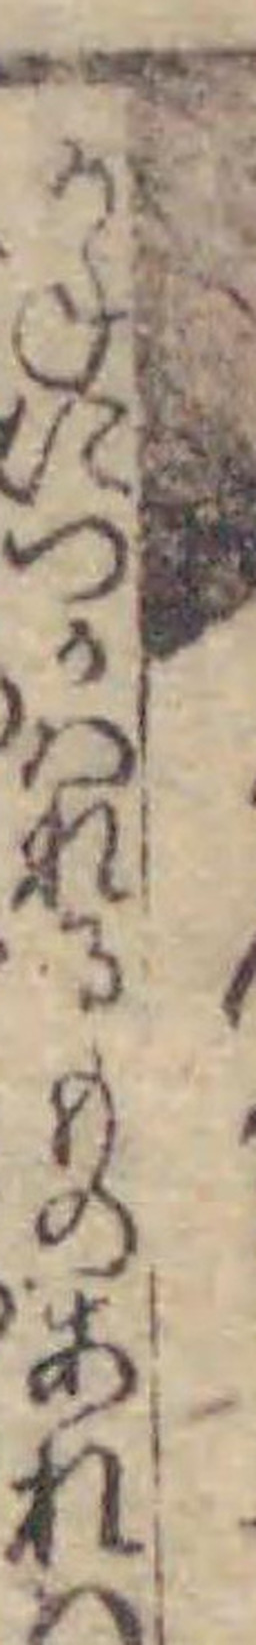かねにつかはれるものあれは
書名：新鋳小判 : 3巻
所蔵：国立国会図書館 National Diet Library, JAPAN
